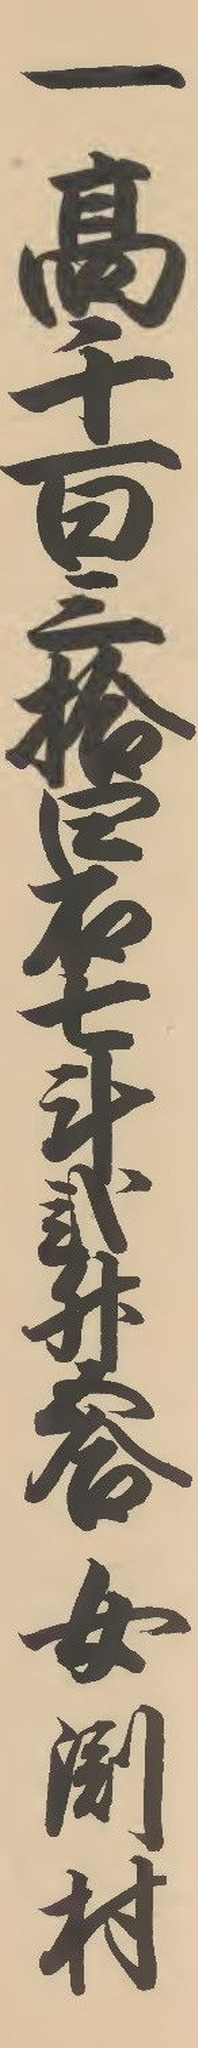一髙千百三拾四石七斗弐升五合女渕村
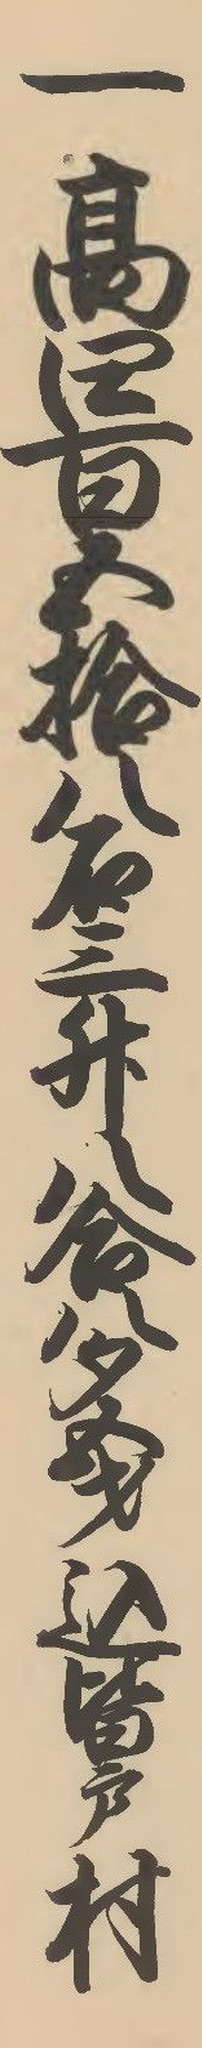一髙四百五拾八石三升八合八夕五才込皆戸村
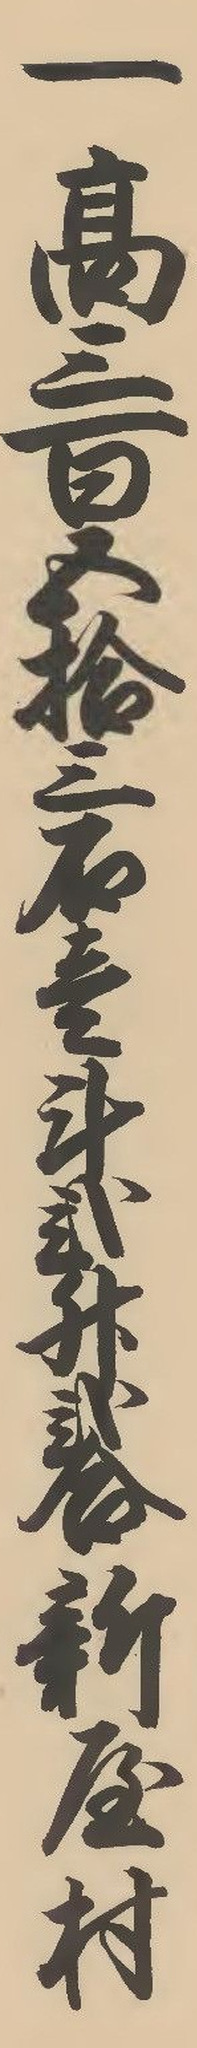一髙三百五拾三石壱斗弐升弐合新屋村
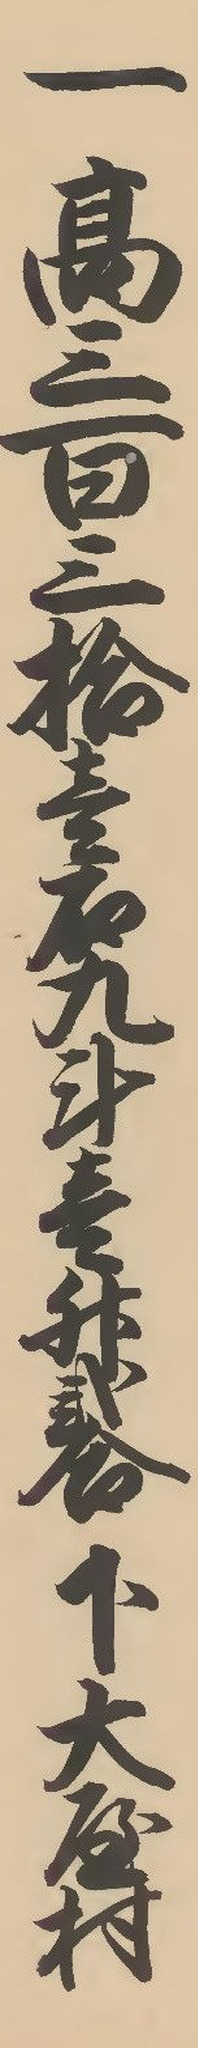一髙三百三拾壱石九斗壱升弐合下大屋村

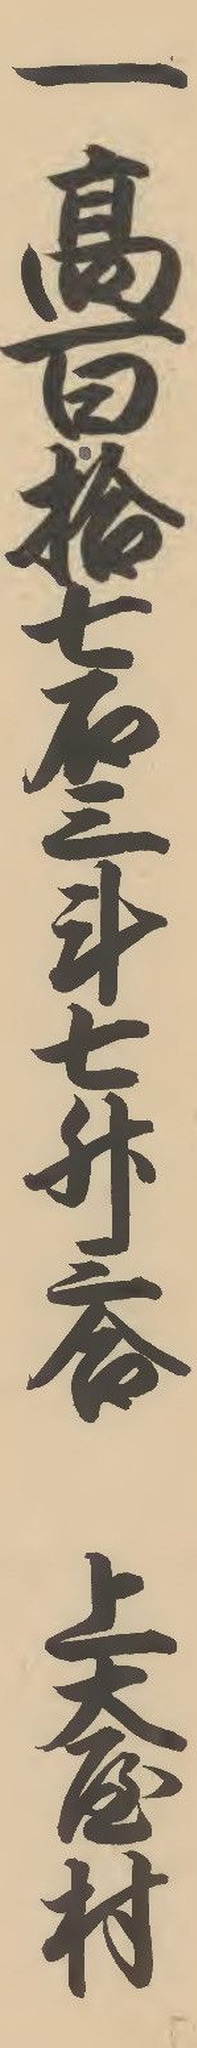一髙百拾七石三斗七升三合上大屋村
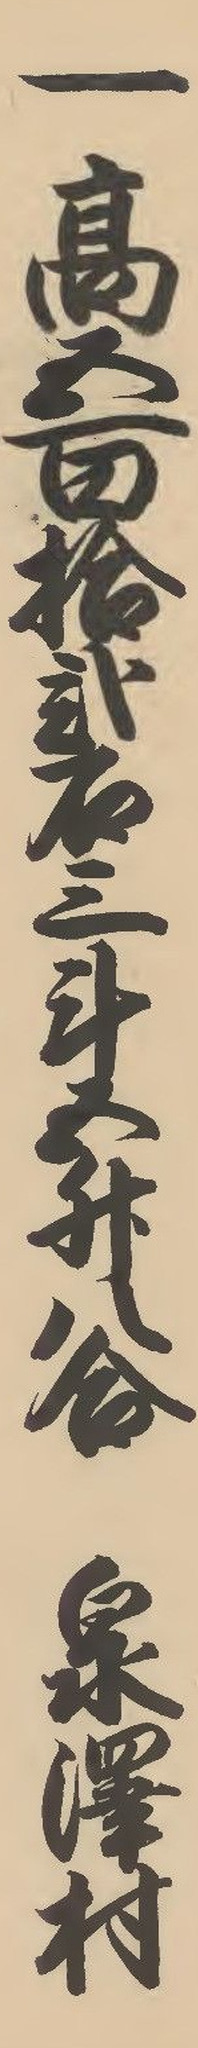一髙五百拾弐石三斗五升八合泉澤村
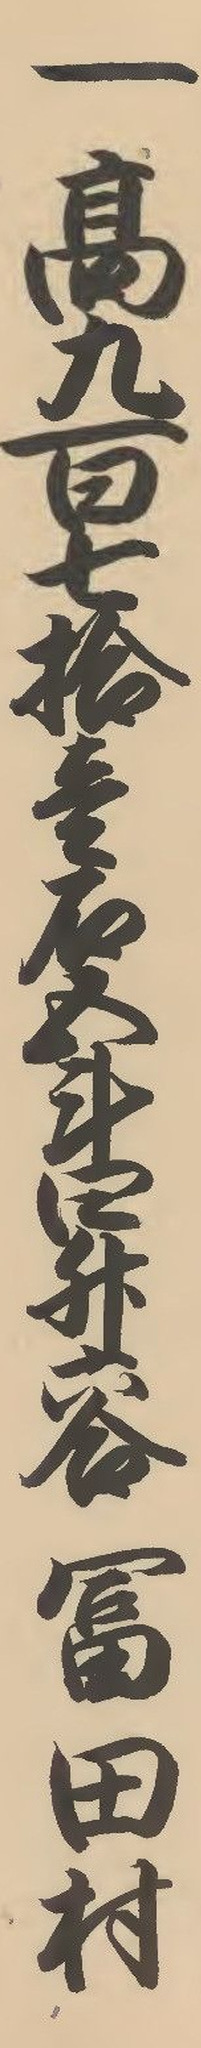一髙九百七拾壱石五斗四升六合冨田村
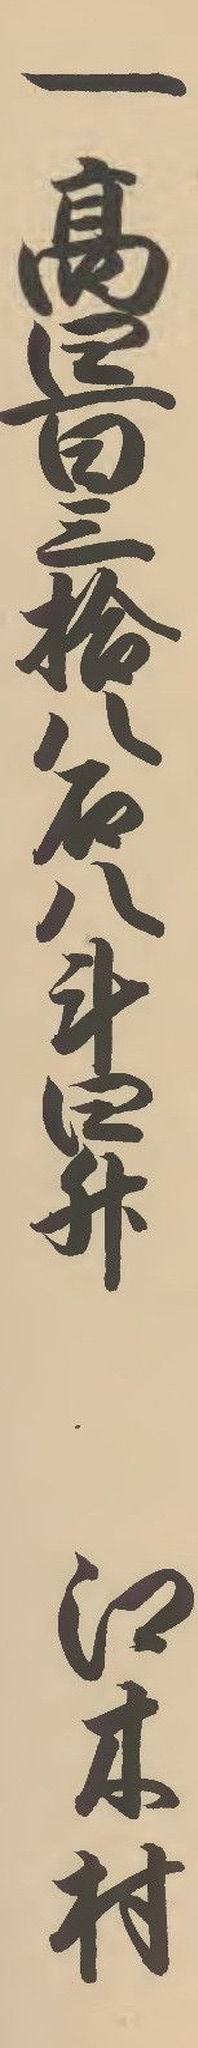一髙四百三拾八石八斗四升江木村
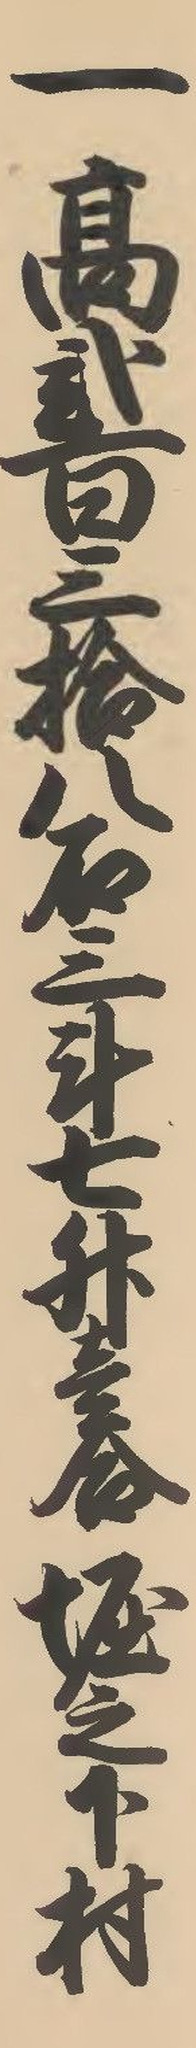一髙弐百三拾八石三斗七升壱合堀之下村
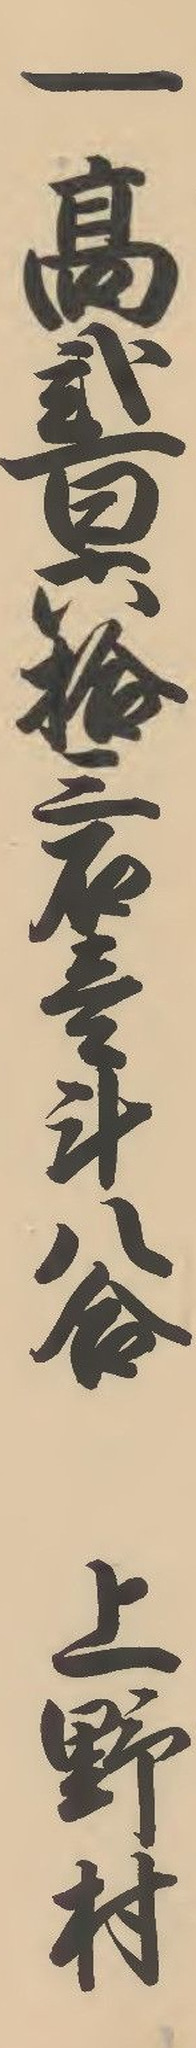一髙弐百六拾三石壱斗八合上野村
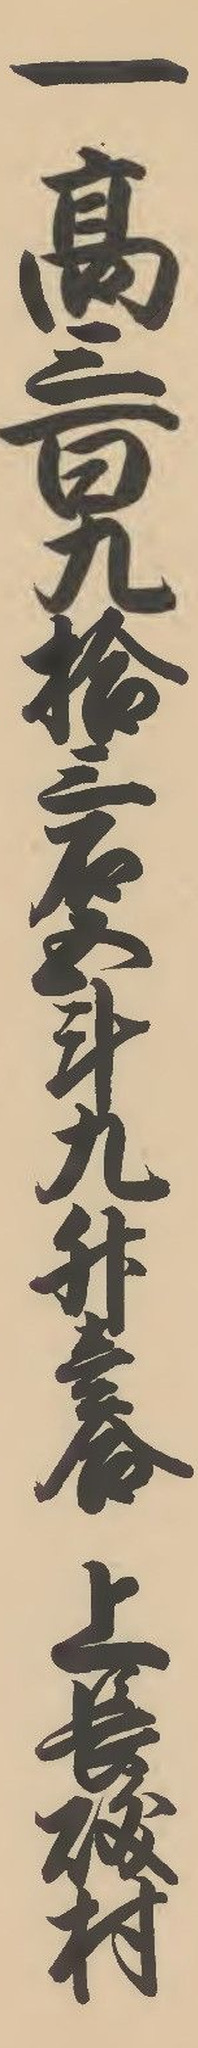一髙三百九拾三石五斗九升壱合上長磯村
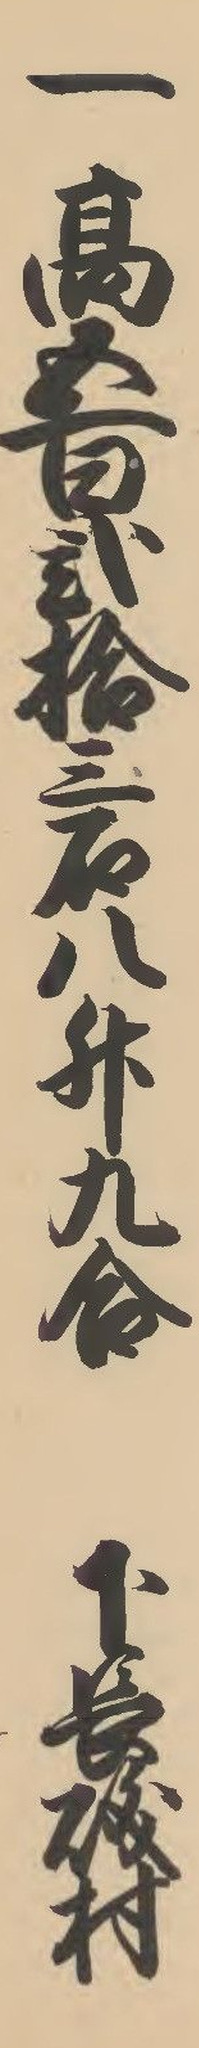一髙五百弐拾三石八升九合下長磯村

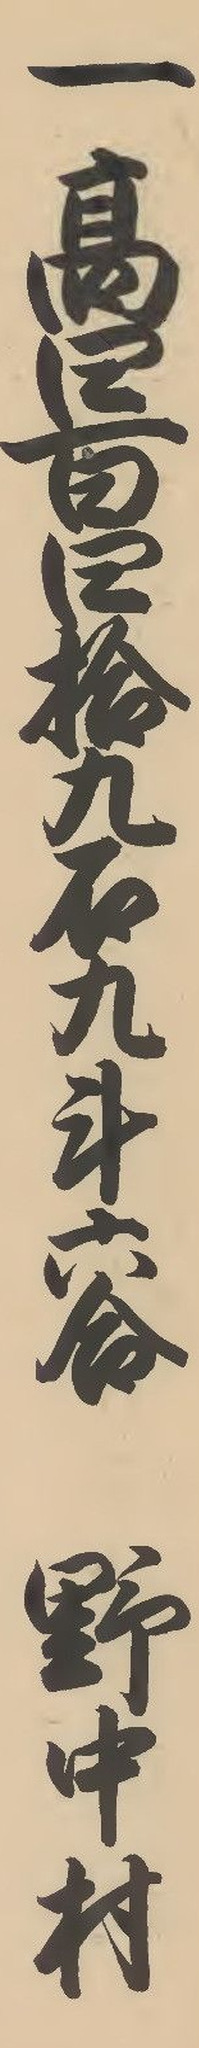一髙四百四拾九石九斗六合野中村
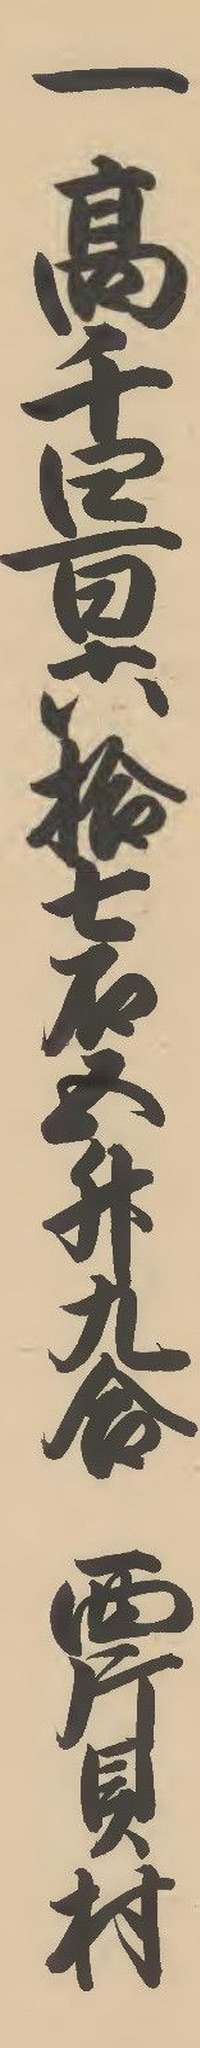一髙千四百六拾七石五升九合西片貝村
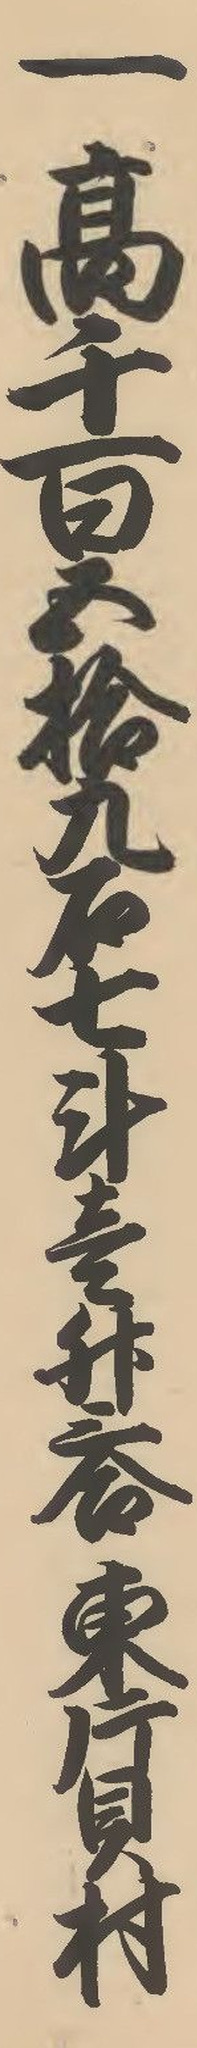一髙千百五拾九石七斗壱升三合東片貝村
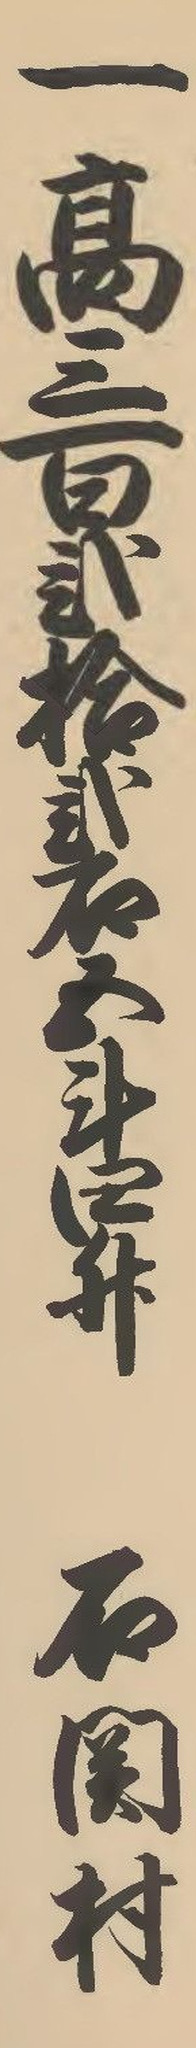一髙三百弐拾弐石五斗四升石関村
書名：上野国郷帳
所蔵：国立公文書館 National Archives of Japan
